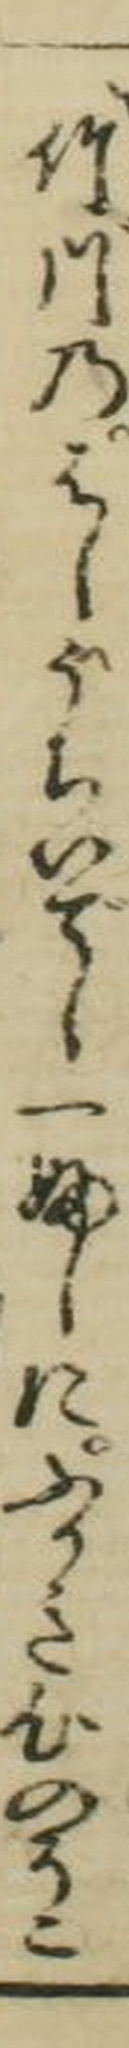〽竹”川の。はしうちいでし一ふしに。ふかき心のそこ
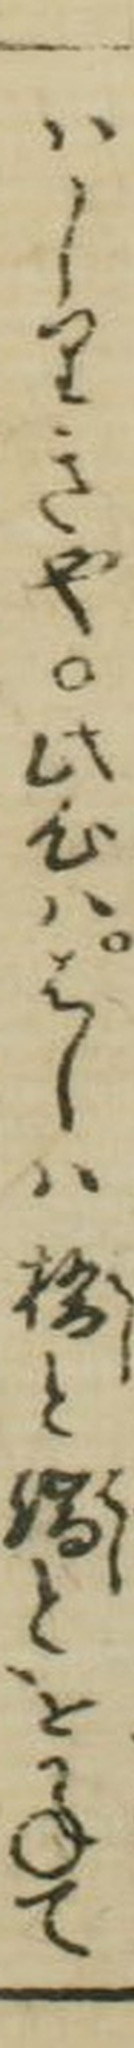はしりきや◯此心は。はしは橋と端とをかねて
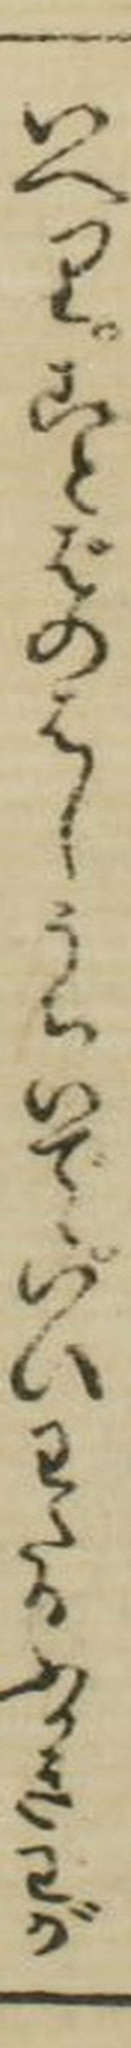いへり。ことばのはしうちいでゝ。いひわたるふかきわが
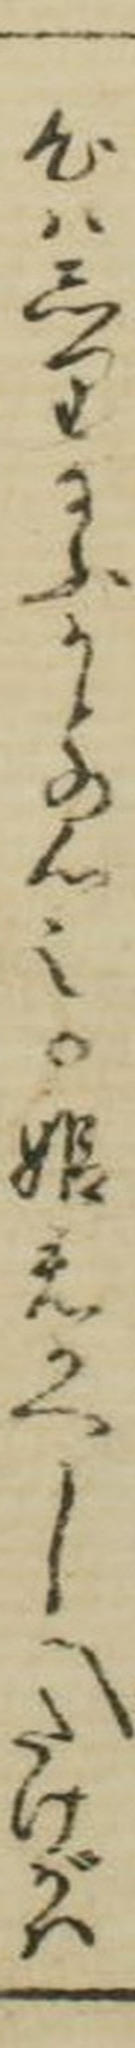心はしり給ふかとの心也。姫君かへし〽たけがは
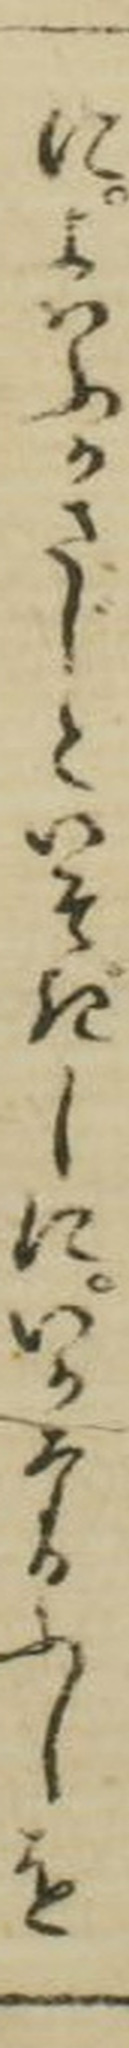に。よはふかさじといそぎしに。いかなるふしを
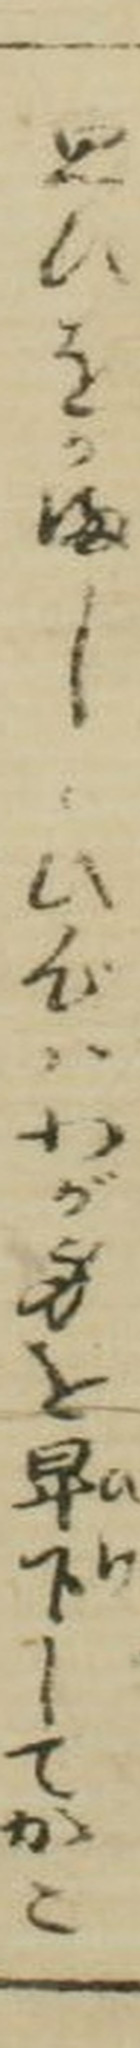思ひをかまし◯此心はわが身を卑下してかこ
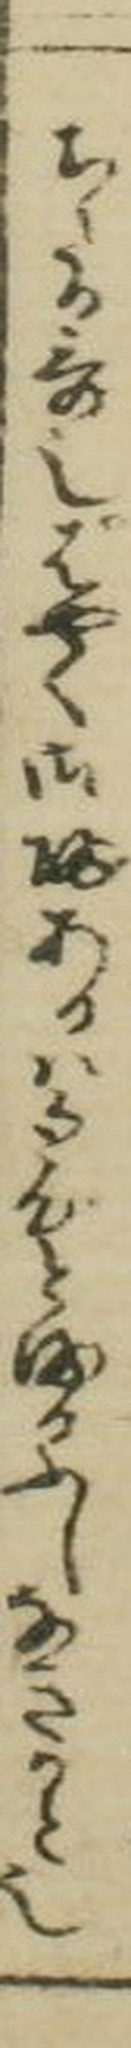ちたる哥也。はやく御帰あるは御心とまるふしなきかと也
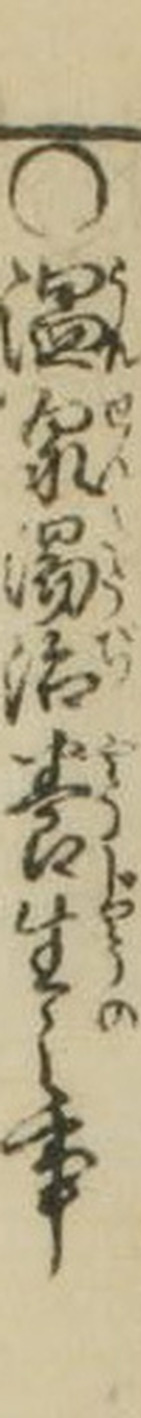◯温泉湯治養生之事
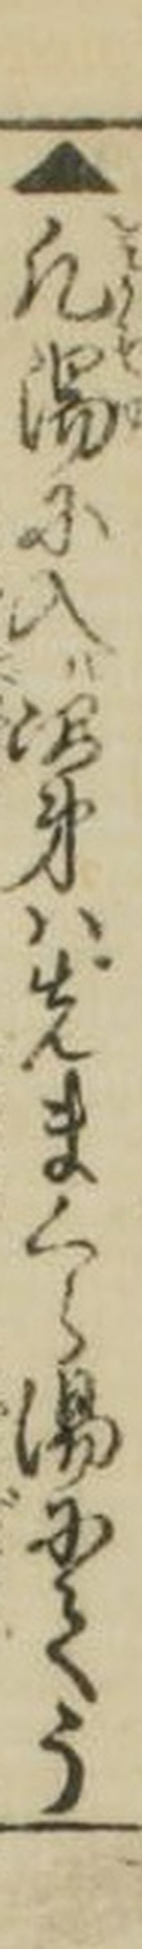▲凡湯に入る次第は。先まくら湯にてう
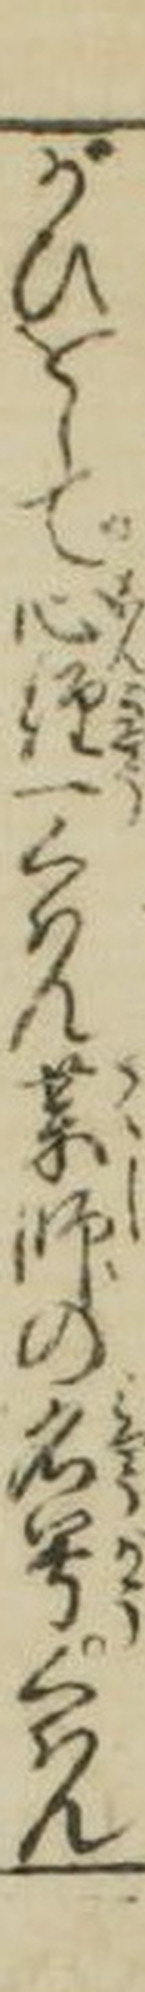がひをして。心経一くはん薬師の名号。くはん
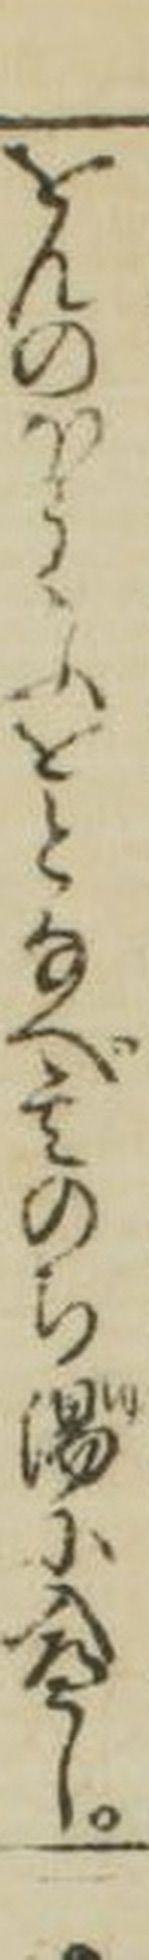をんのほうかうをとなへ。其のち湯に入へし。
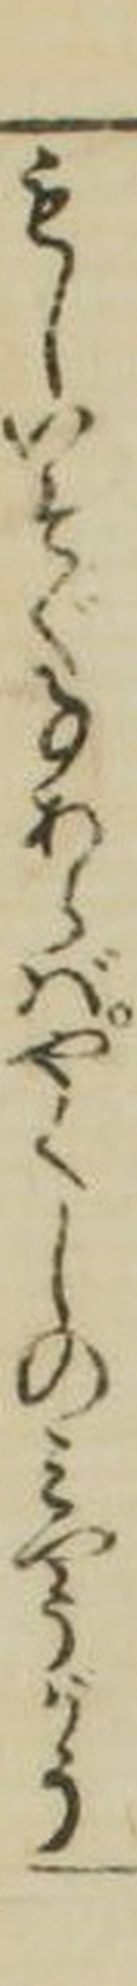もしいそぐ事あらば。やくしのみやうがう
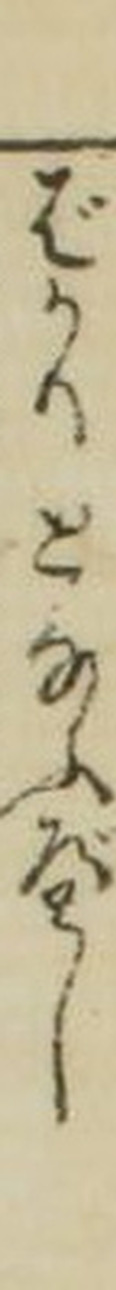ばかりとなふべし
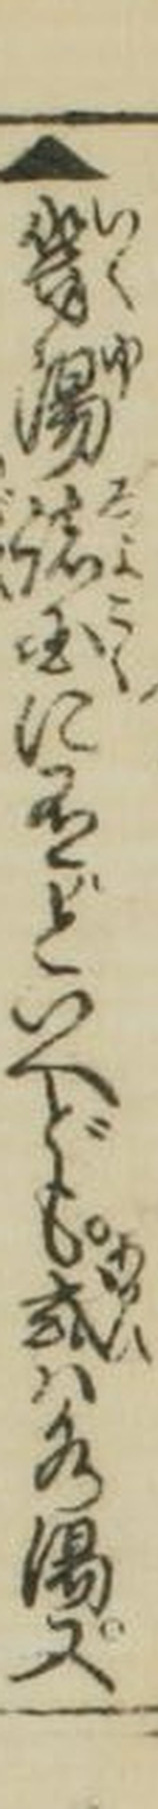▲幾湯諸国に有るといへども。或は水湯。又
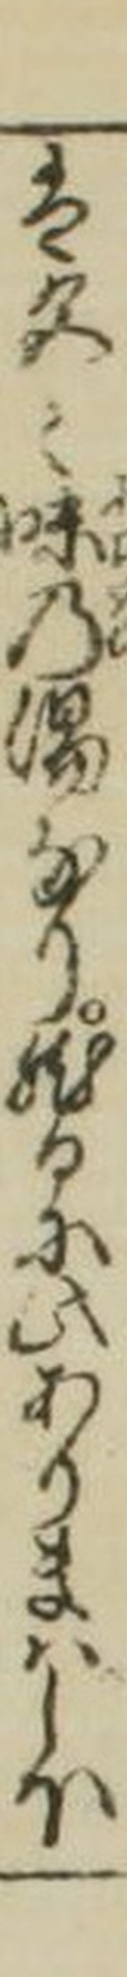は色々味の湯なり。然るに此ありまはしほ
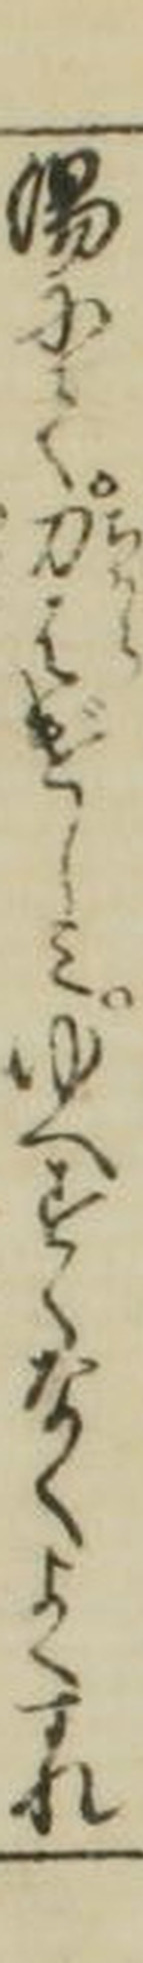湯にて。力はげしみ。ゆへすくなくよくすれ
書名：女源氏教訓鑑
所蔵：東京学芸大学附属図書館
